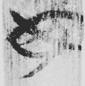𡚦
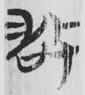敢
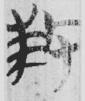殺
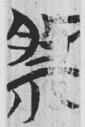祭
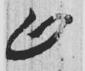㠯（以）
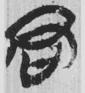君
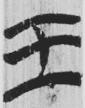王
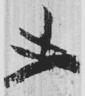之
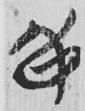身
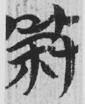殺
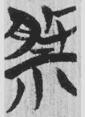祭
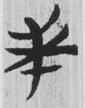未
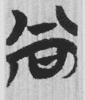尚（嘗）
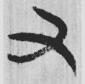又（有）
